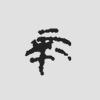不
